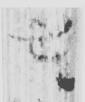心
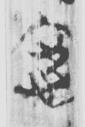{宀邑心}
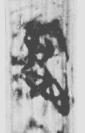{宀肙心}
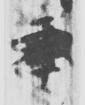不
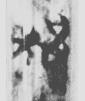楫
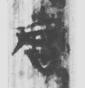君
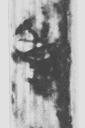事
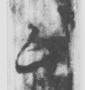㠯（以）
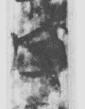辱
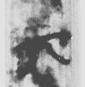亓
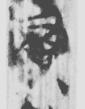君
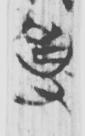事
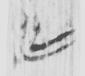亡
